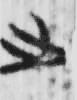之
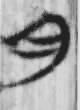月
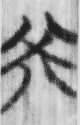癸
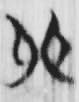卯
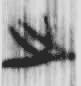之
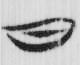日
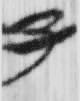子
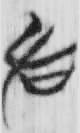左
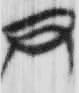尹
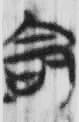命
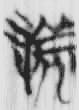漾
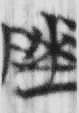陵
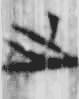之
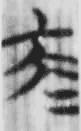大夫
